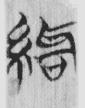紿
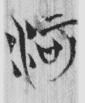河
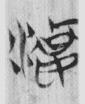淒
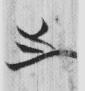之
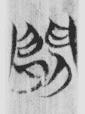{門夕刀}
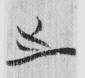之
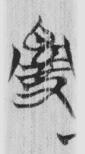𤔔
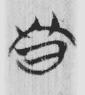冬
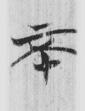不
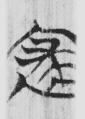裘
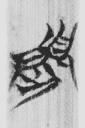{日止頁}
